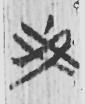我
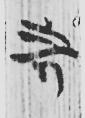先
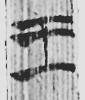王
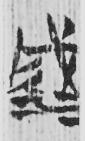{水戌}
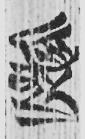{日止頁}（夏）
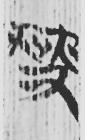{火火又}
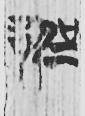{邑弓口二}
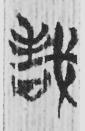{毛戈口}
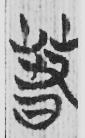萅
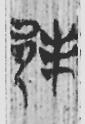邦
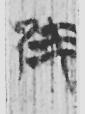隹
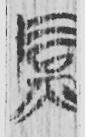庶
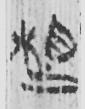{相止}
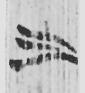之
